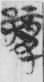○（复）
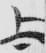上
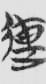連
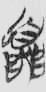囂
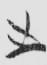之
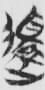還
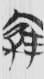○（集）
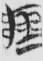瘳
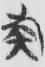○（族）
